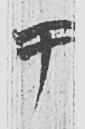于
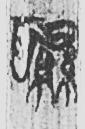{耳㬎}
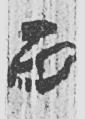{云山}
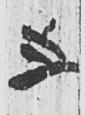之
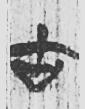故
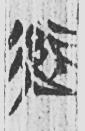率
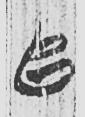𠂤
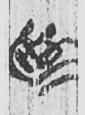爲
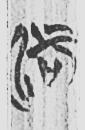河
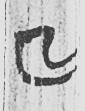曲
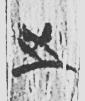之
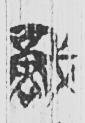戰
